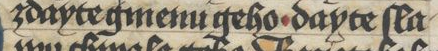zdayte gmenu geho.dayte ſla¬
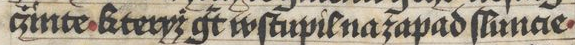cżinte.kteryż ḡt wſtupil na zapad ſluncie.
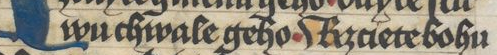wu chwale geho.Rzciete bohu
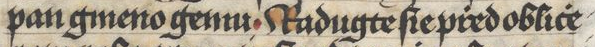pan gmeno gemu.Radugte ſie pṙed obliċe¬
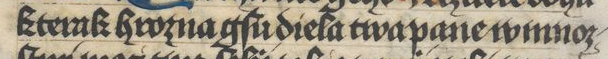kterak hrozna gſu díela twa pane wmnoz¬
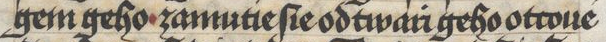gem geho.zamutie ſie od twaṙi geho otcoué
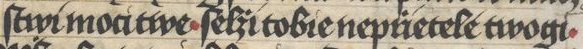ſtwí moci twe.ſelżí tobie nepṙíetelé twogi.
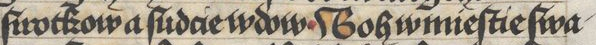ſirotkow a ſudcie wdow.Boh wmieſtie ſwa¬
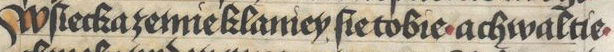Wẛiecka zemie klaniey ſie tobie.a chwaltie.
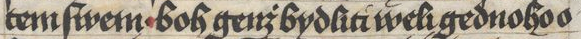tem ſwem.bóh genż bydliti weli gednoho o¬
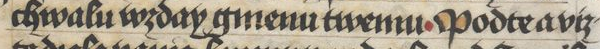chwalu wzday gmenu twemu.Podte a viz¬
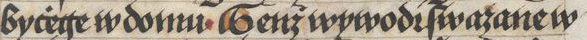byċege w domu.Genż wywodí ſwazane w
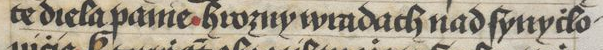te diela panie.hrozny wradach nad ſyny ċlo¬
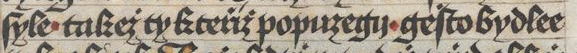ſyle.takeż ty kteṙíż popuzegu.geẛto bydlee
